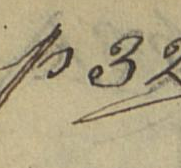p 32
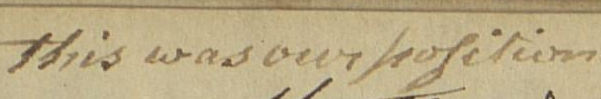this was our position
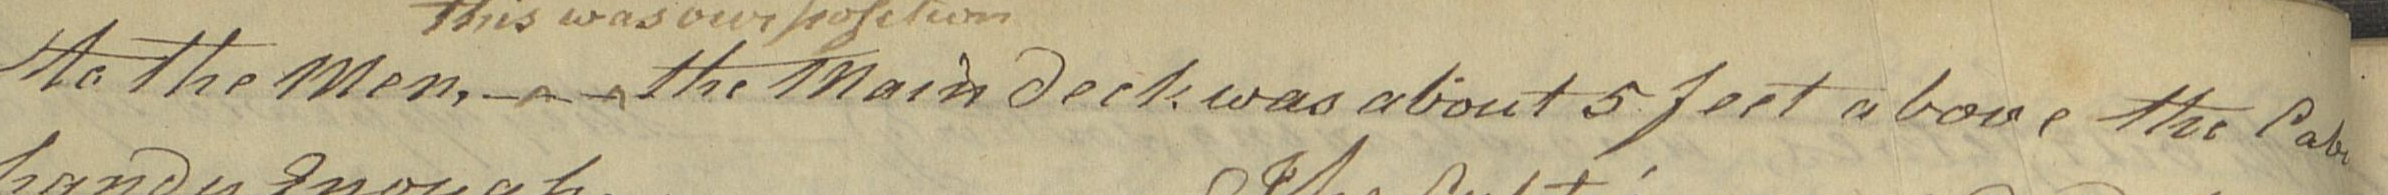to the Men. ^ ^ the Main deck was about 5 feet above the Cab-
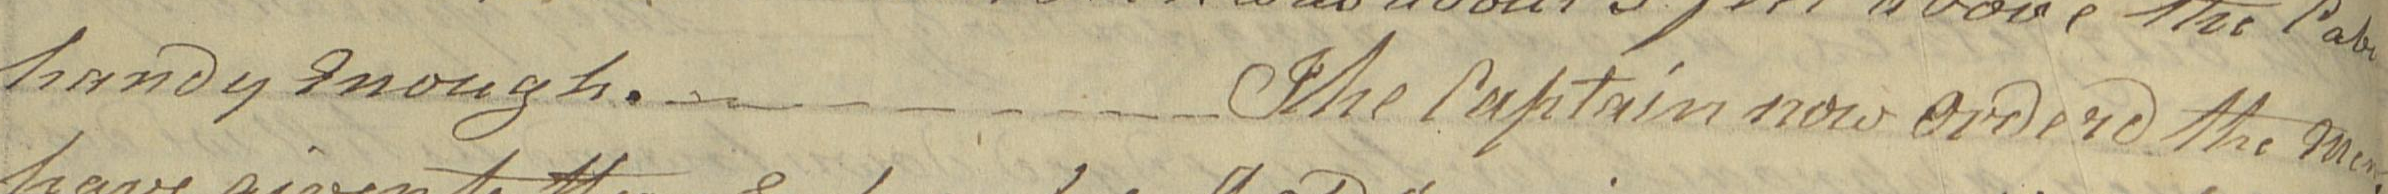handy enough. The captain now ordered the men
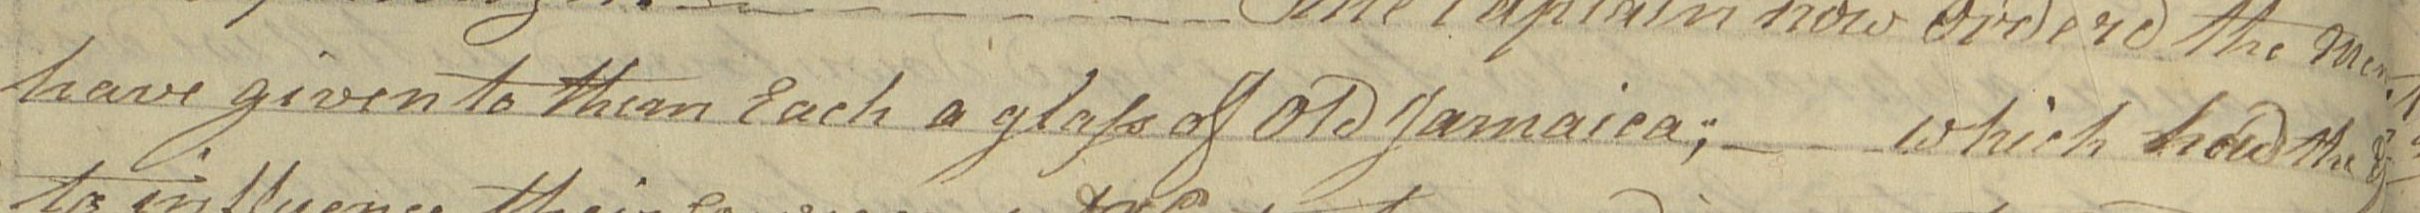have given to them Each a glass of old Jamaica;-- which had the
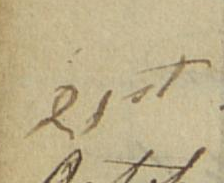21^st
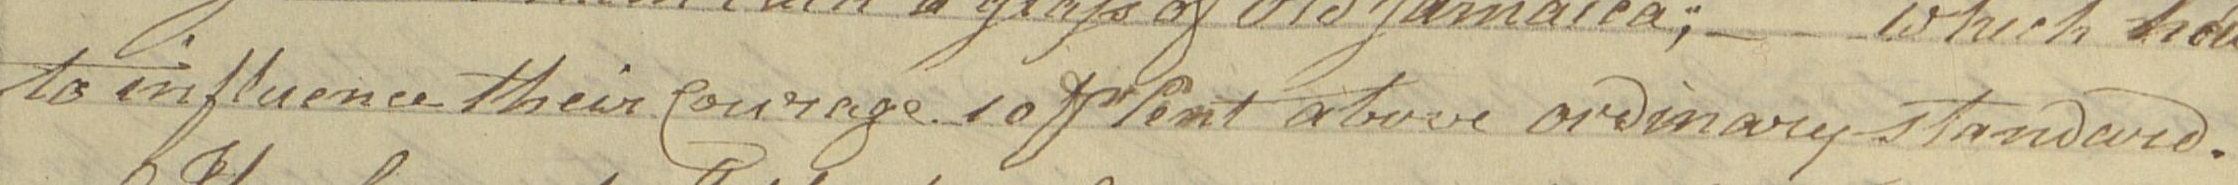to influence their Courage 10 percent above ordinary strandard
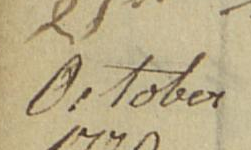October
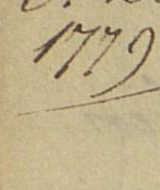1779
